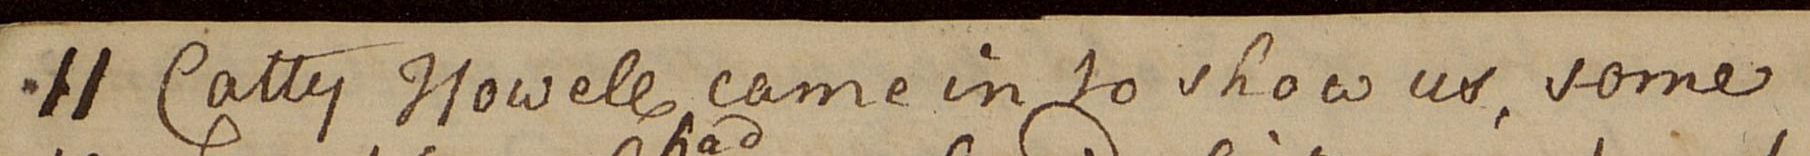11 Catty Howell came in so show us, some
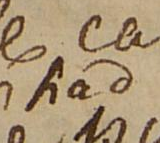had
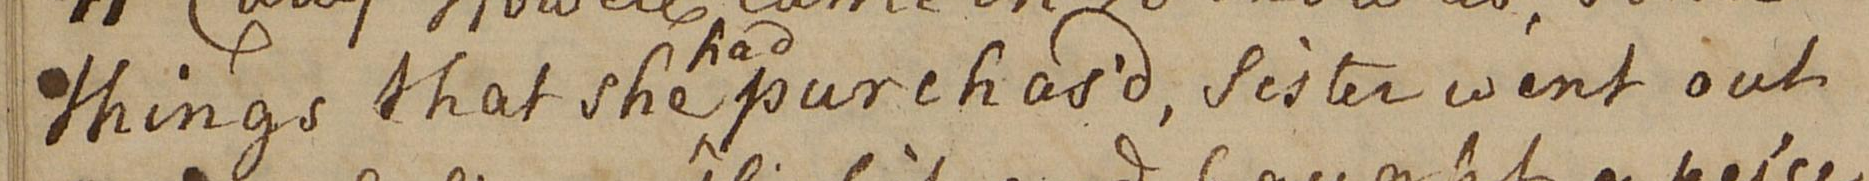things that she ^ purchas'd, Sister went out
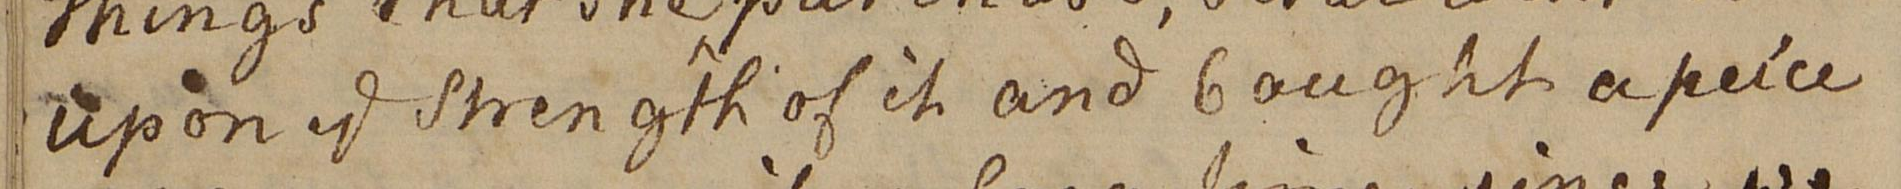upon y^e Strength of it and baught a peice
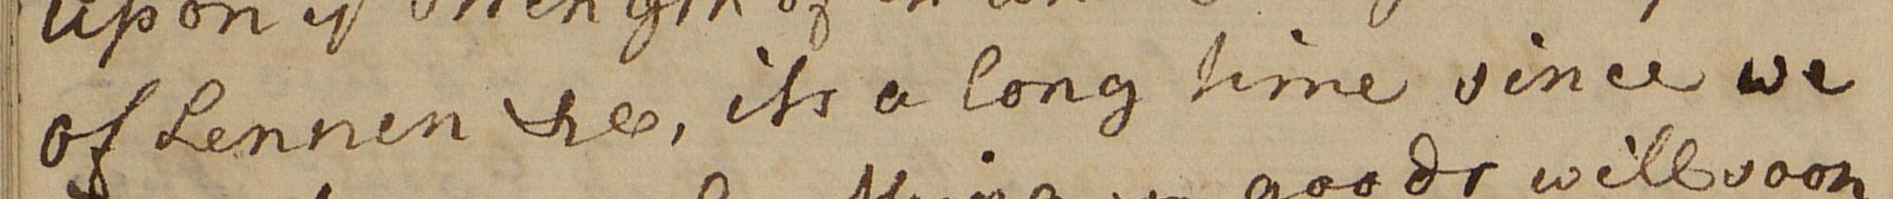of Lennen &c, its a long time since we
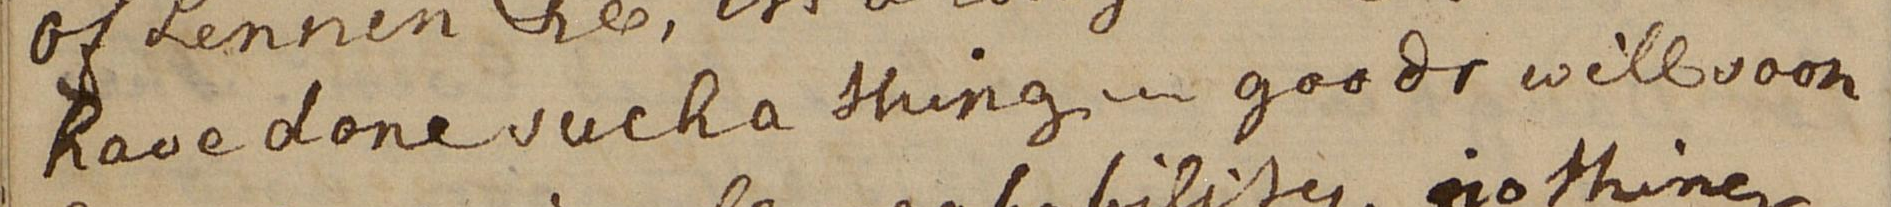have done such a thing - goods will soon
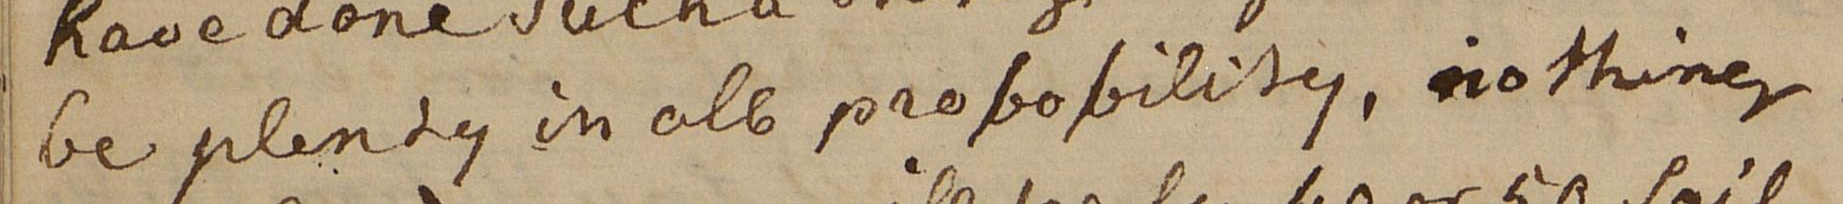be plenty in all probobility, no thing
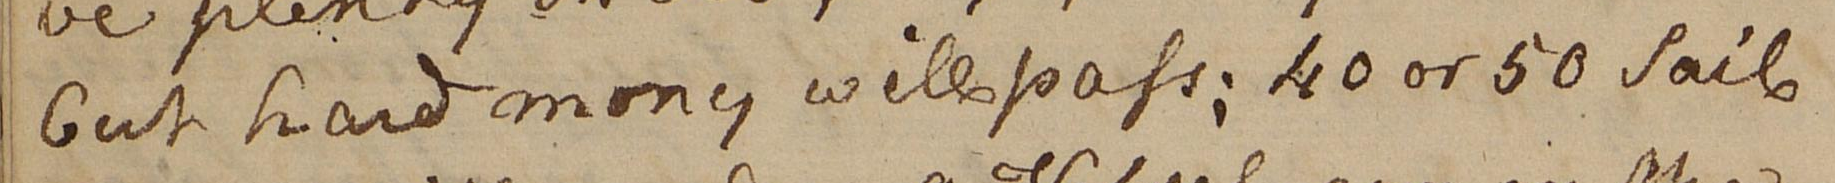but hard mony will pass; 40 or 50 sail
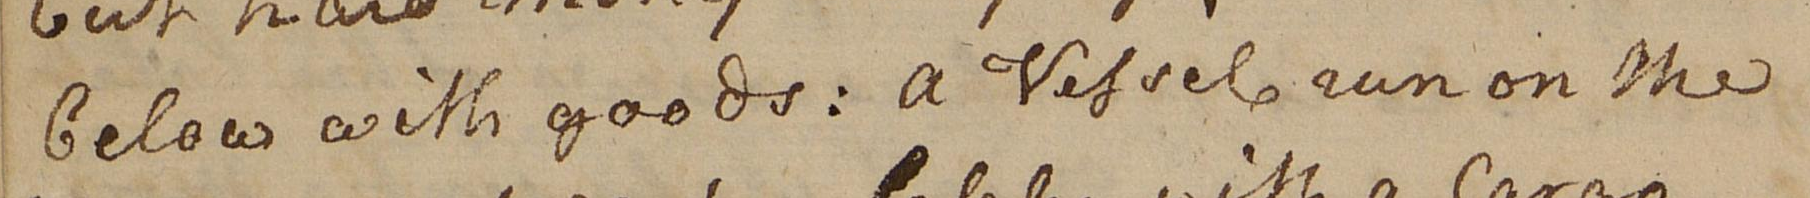below with goods: a Vessel run on the
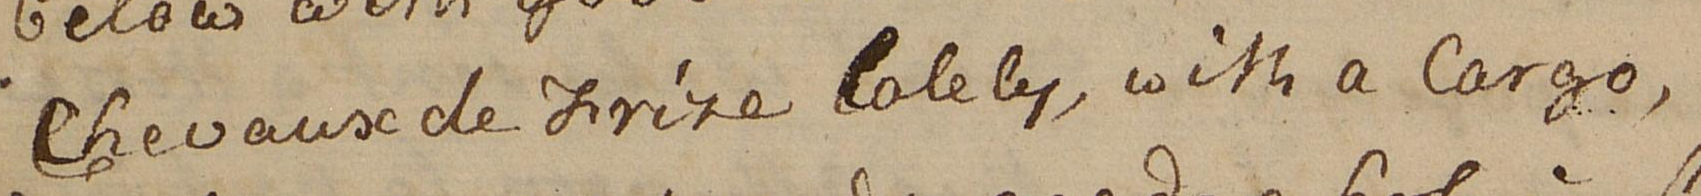Chevaux de Frize Colely, with a Cargo,
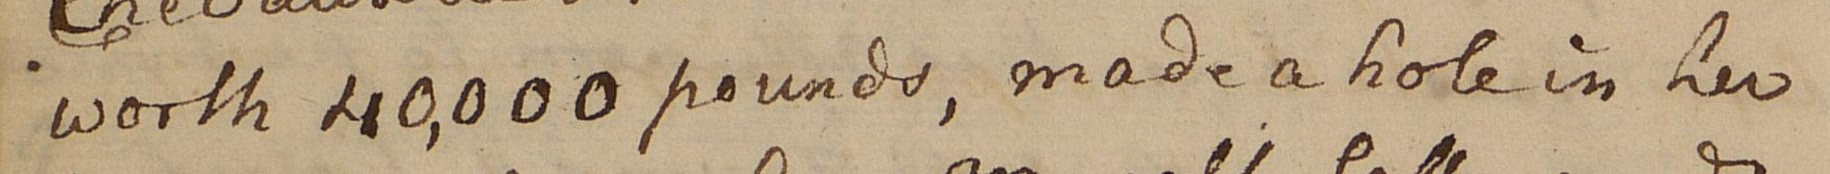worth 40,000 pounds, made a hole in her
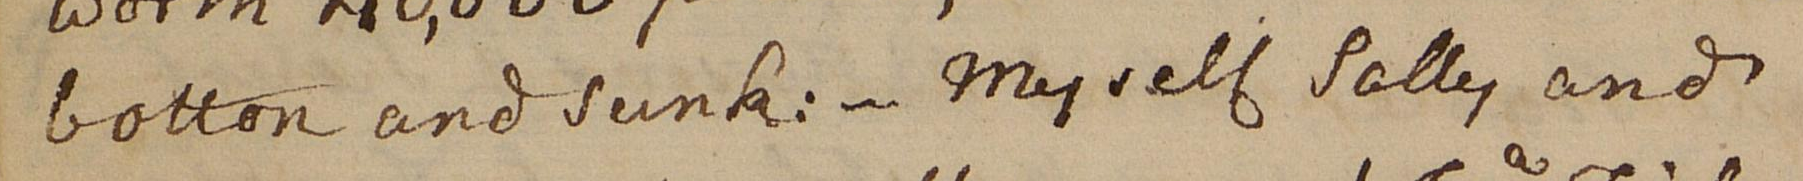botton and sunk:- Myself Sally and
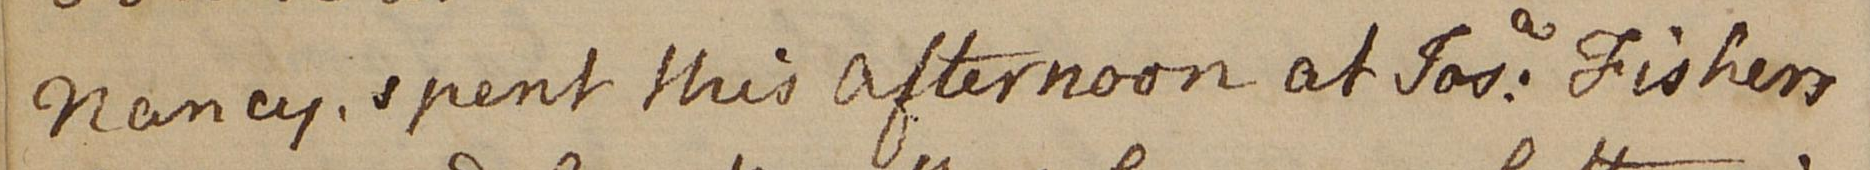Nancy. spent this Afternoon at Jos^a: Fishers
